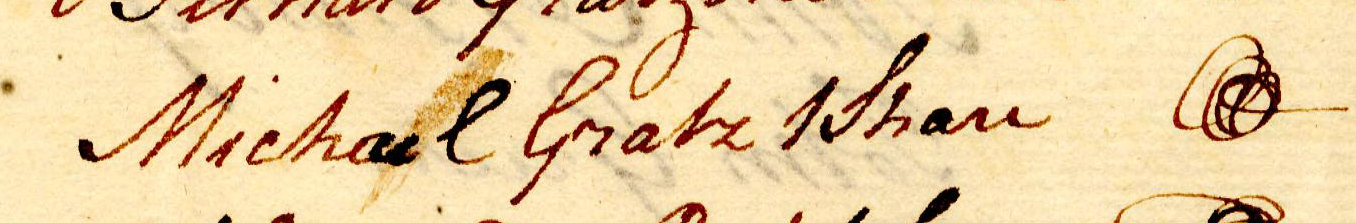Michael Gratz 1 Share
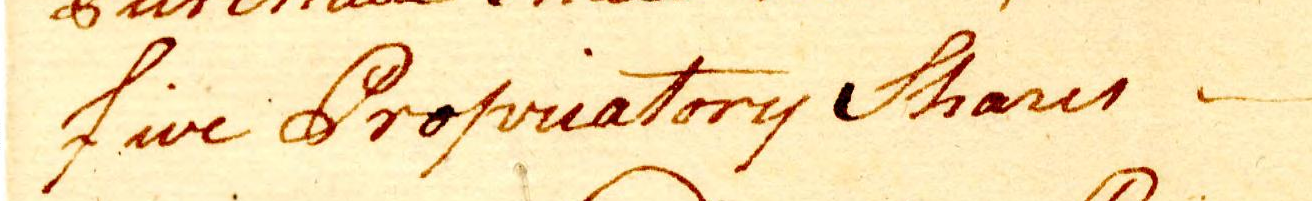five Propriatory Shares-
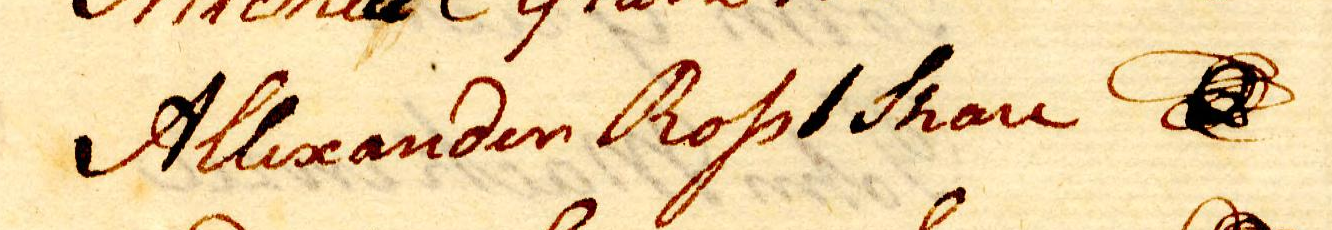Allexander Ross 1 Share
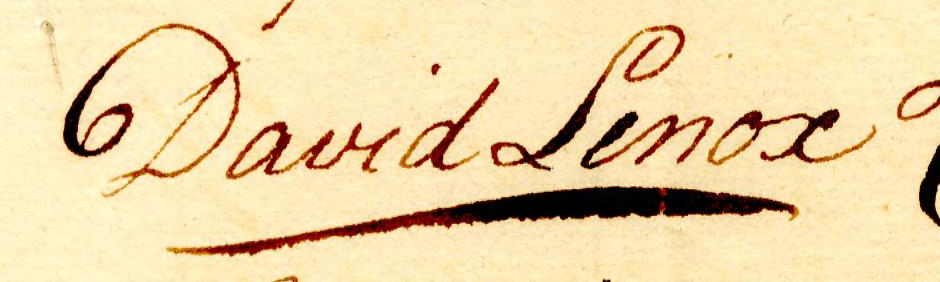David Lenox
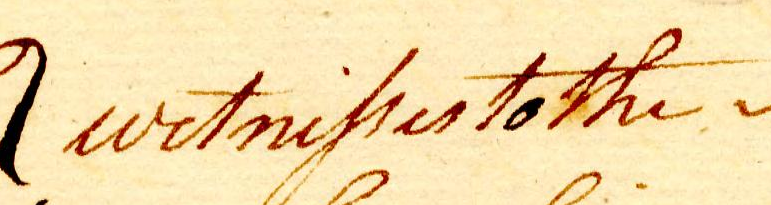witnisses to the
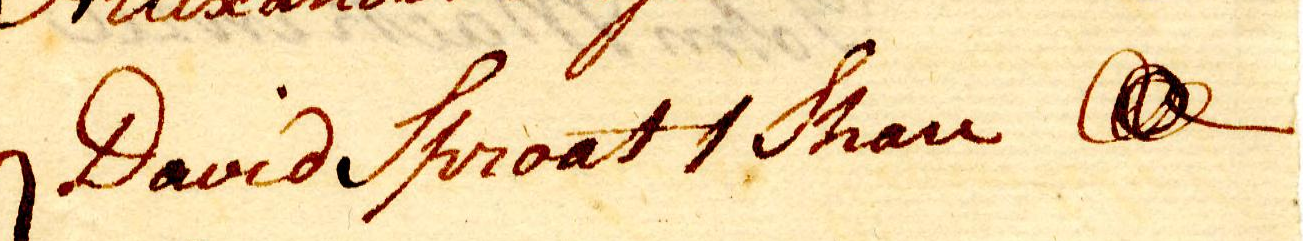David Sproat 1 Share
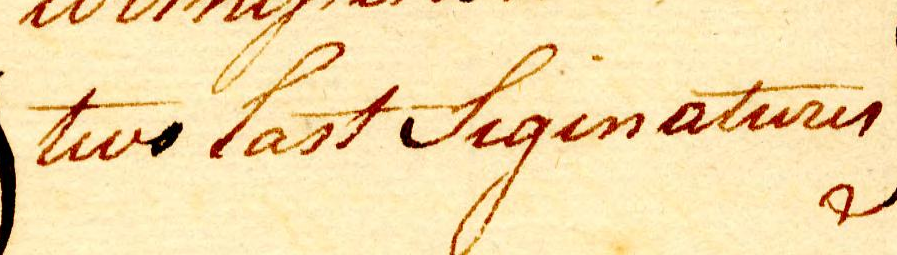two last Signature
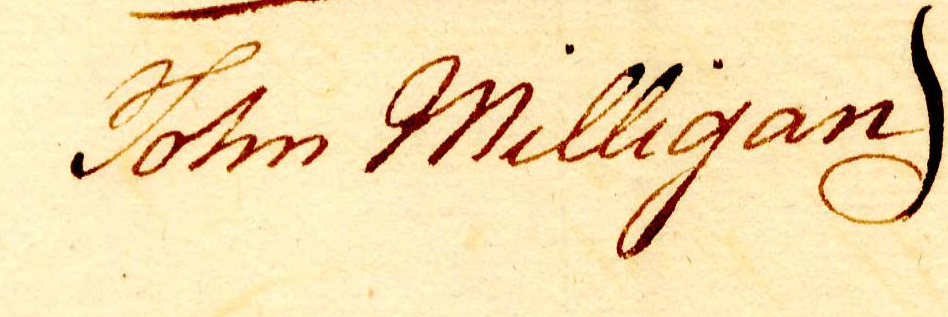John Milligan
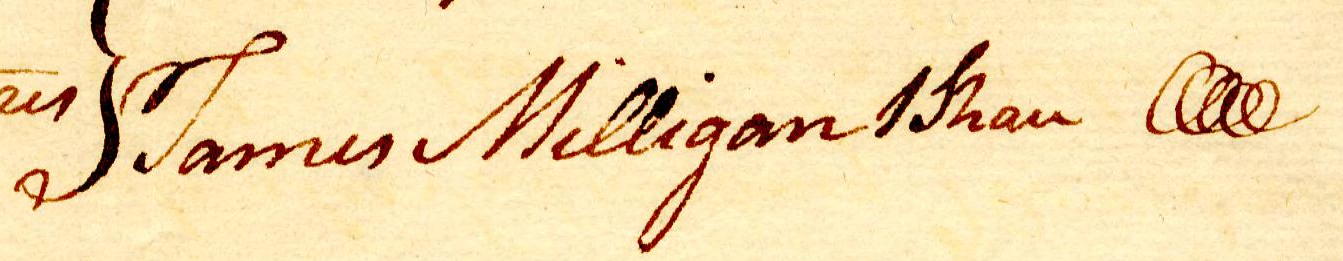James Milligan 1 Share
